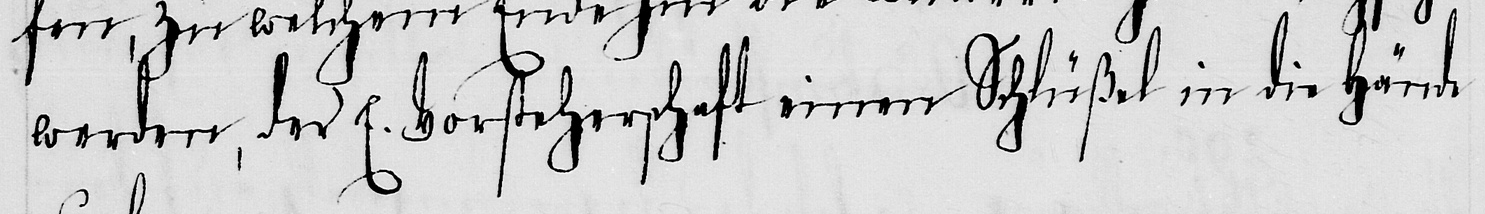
werden, der E. Vorsteherschaft einen Schlüßel in die Hände
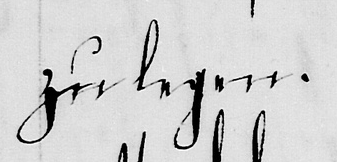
zu legen.
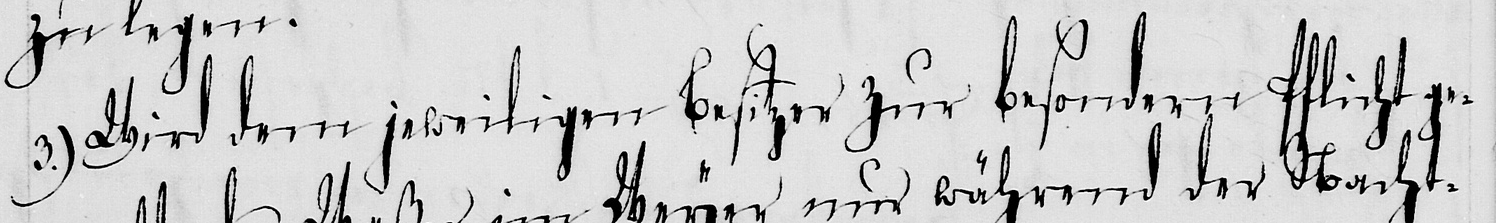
3.) Wird dem jeweiligen Besitzer zur besondern Pflicht g¬
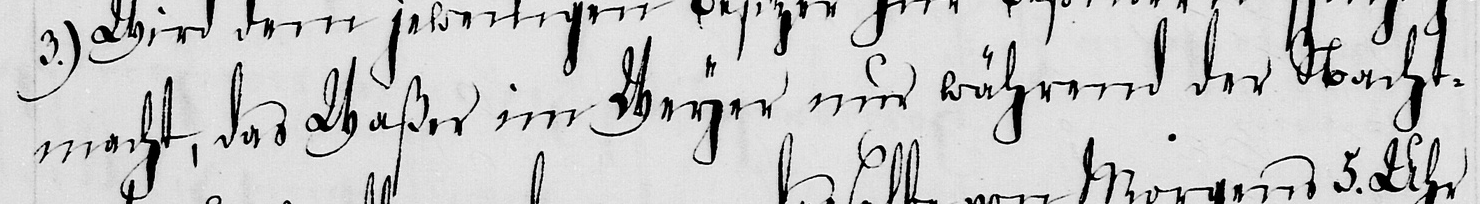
emacht, das Waßer im Weyer nur während der Nacht¬
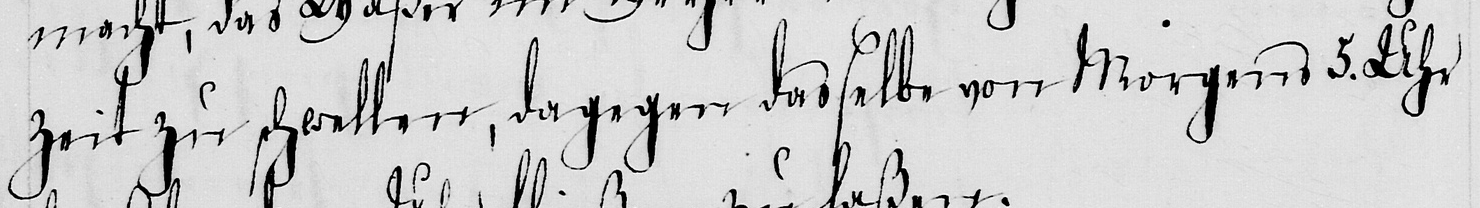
zeit zu schwellen, dagegen dasselbe von Morgens 5. Uhr
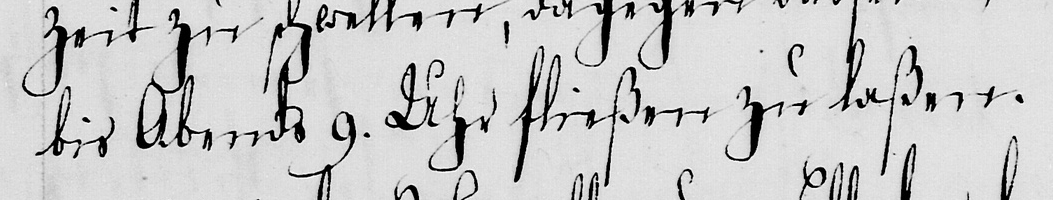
bis Abends 9. Uhr fließen zu laßen.
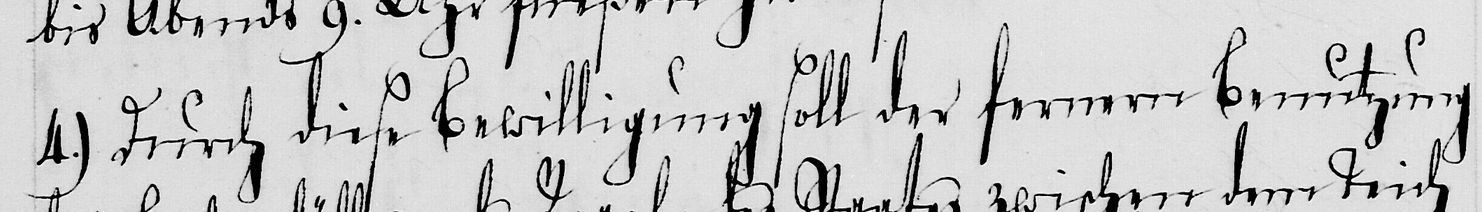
4.) Durch diese Bewilligung soll der fernern Benutzung
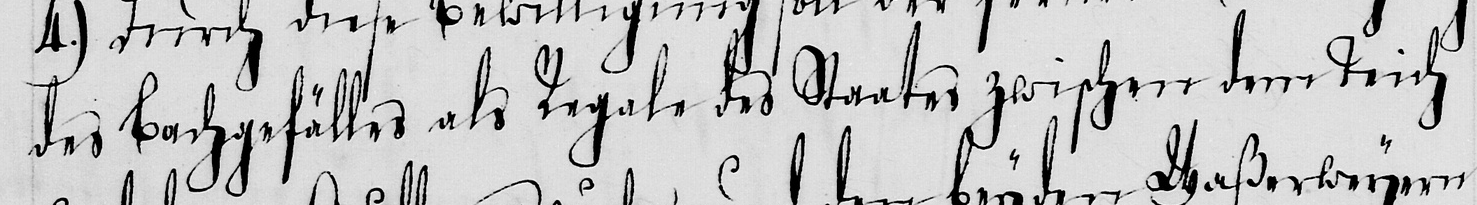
des Bachgefälles als Regale des Staates zwischen dem Teich
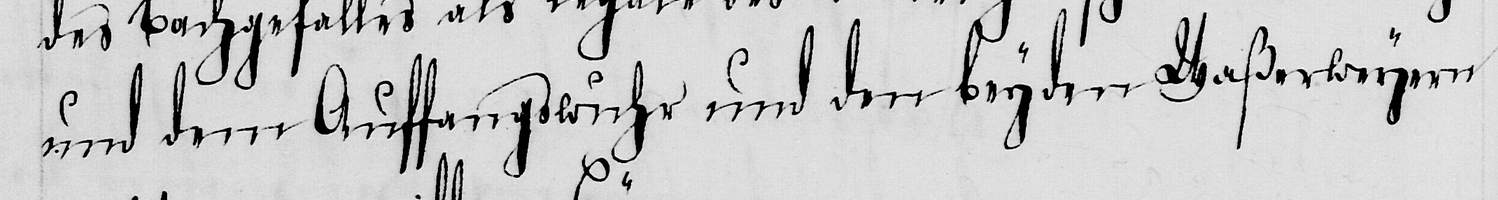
und dem Auffangswuhr und den beyden Waßerweyern
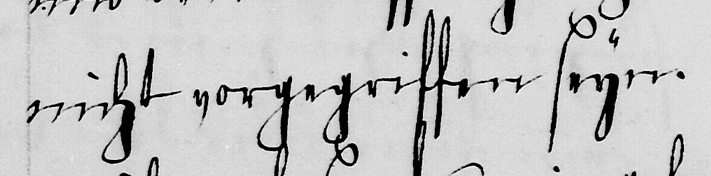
nicht vorgegriffen seyn.
